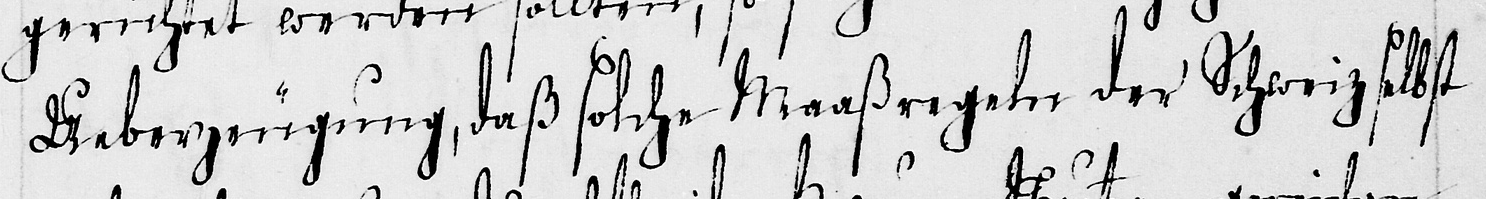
Ueberzeugung, daß solche Maaßregeln der Schweiz selbst
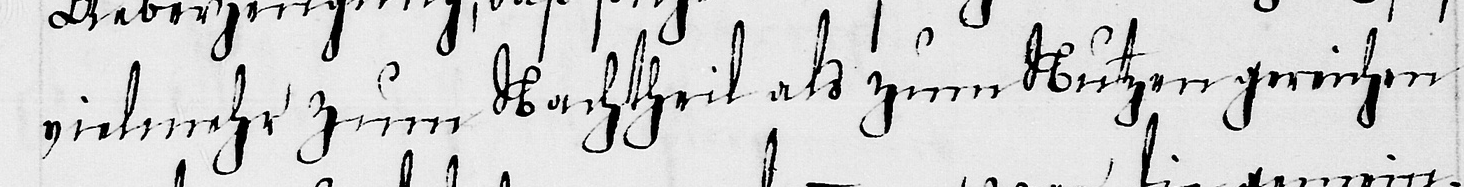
vielmehr zum Nachtheil als zum Nutzen gereichen
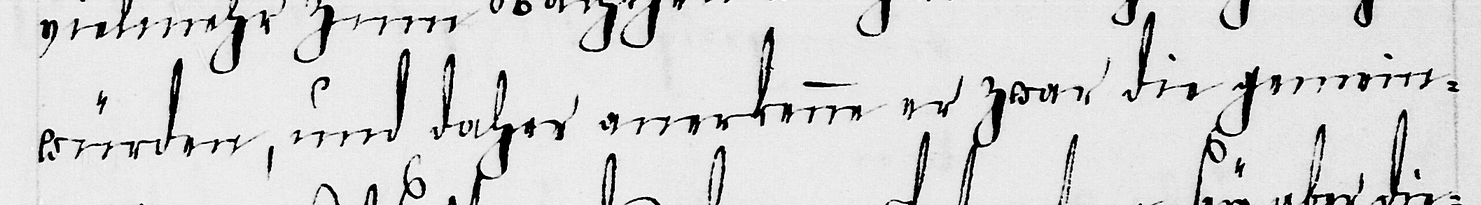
würden, und daher anerkenne er zwar die gemein¬
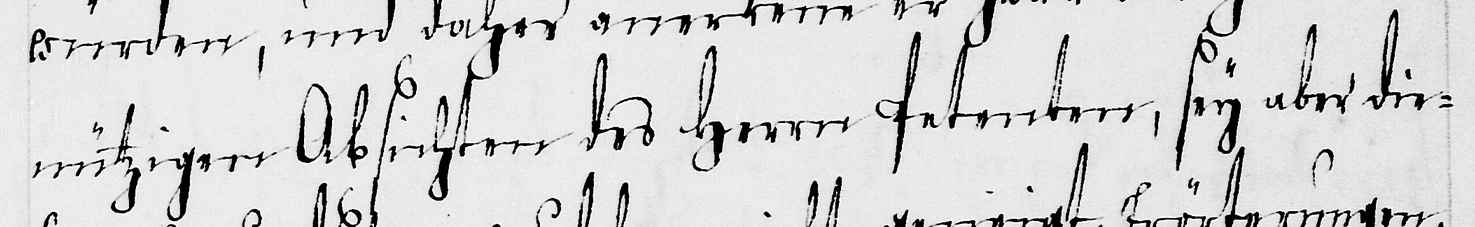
nützigen Absichten des Herrn Petenten, sey aber die¬
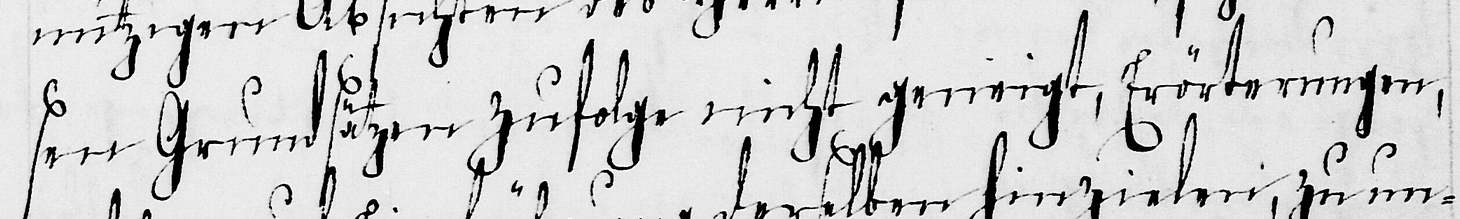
sen Grundsätzen zufolge nicht geneigt, Erörterungen,
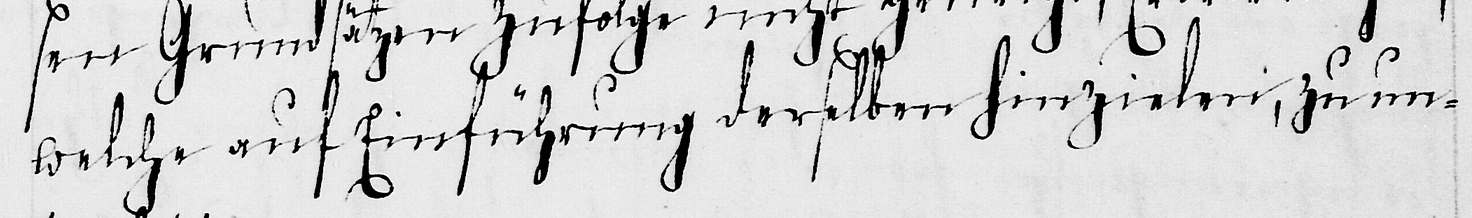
welche auf Einführung derselben hinzielen, zu un¬
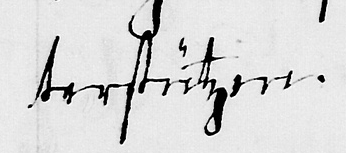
terstützen.
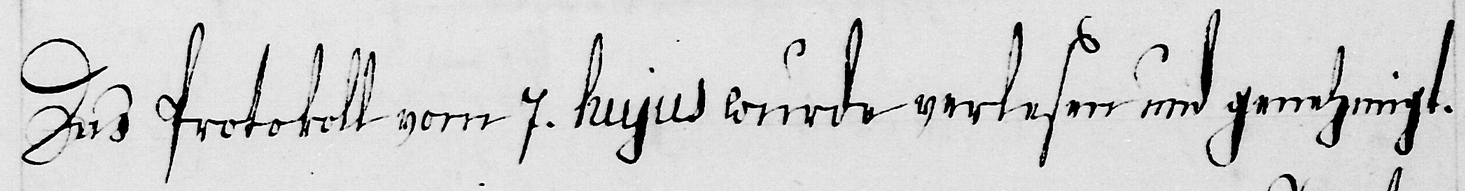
Das Protokoll vom 7. hujus wurde verlesen und genehmigt.
